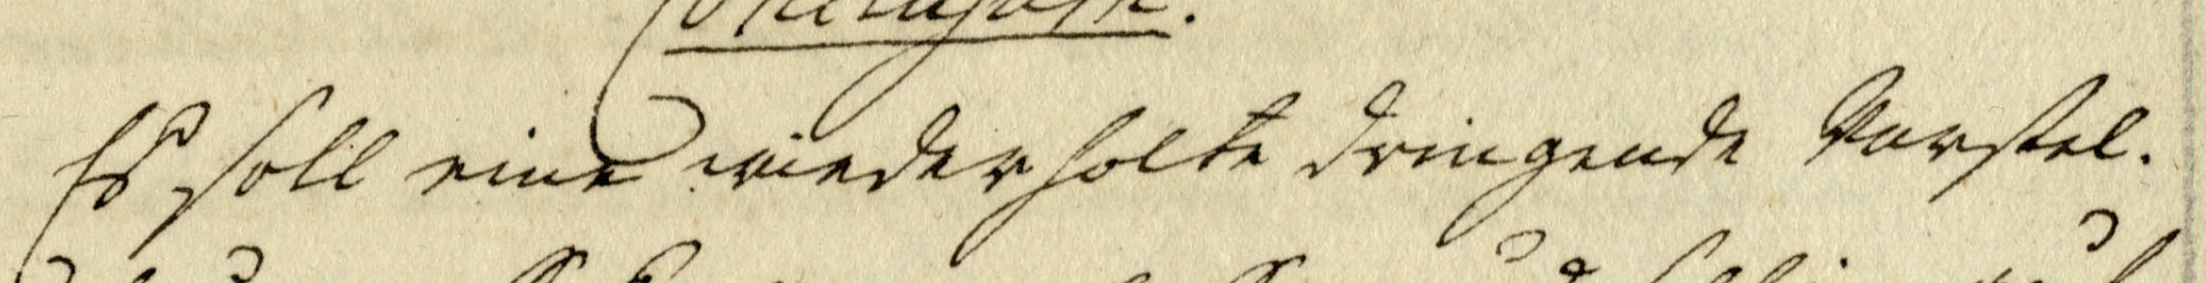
Es soll eine wiederholte dringende Vorstel¬
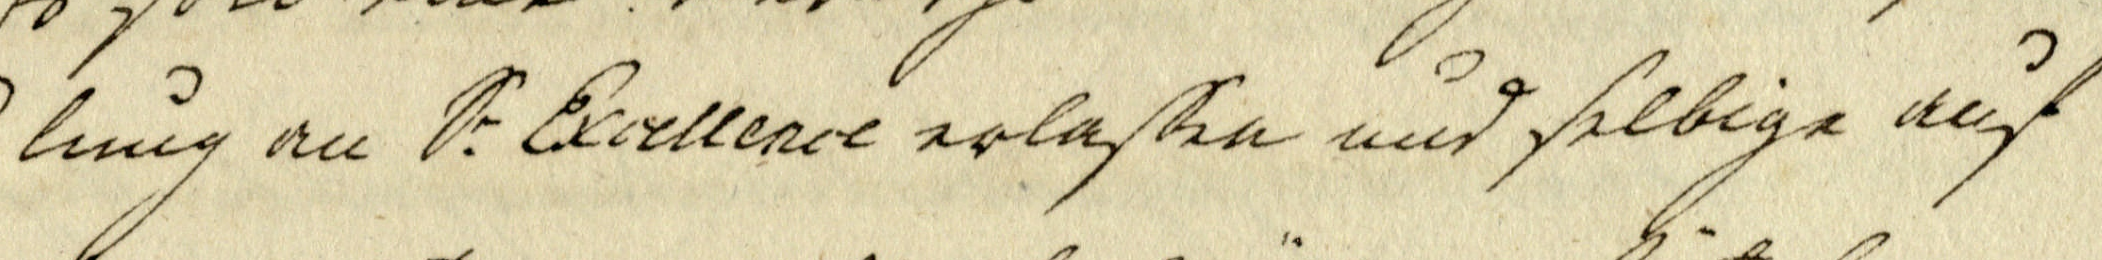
lung an Sr Excellence erlassen und selbige auf
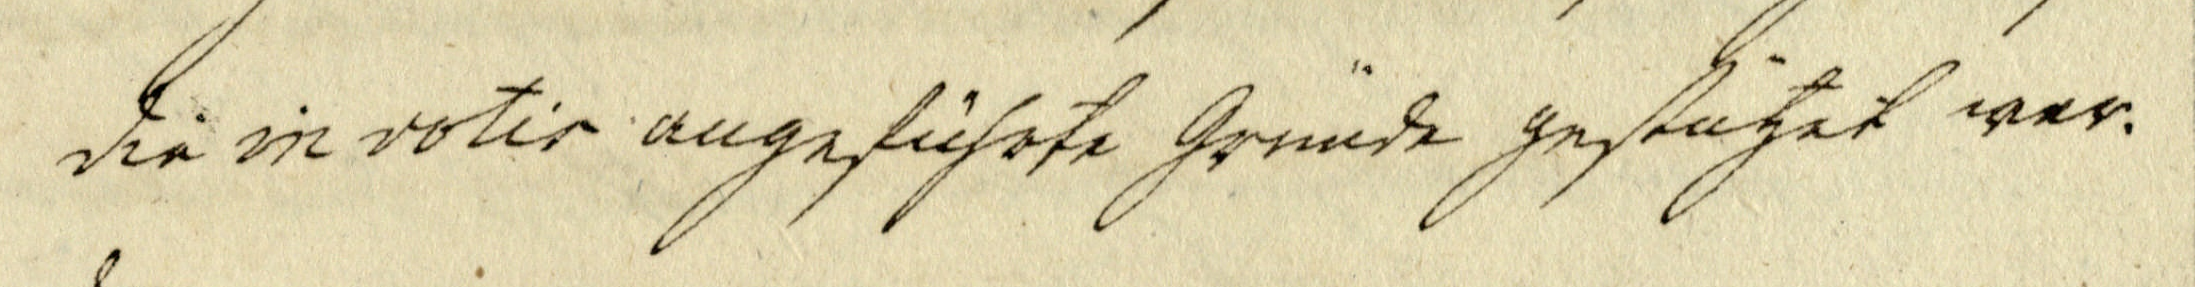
die in votis angeführte Gründe gestützet wer¬
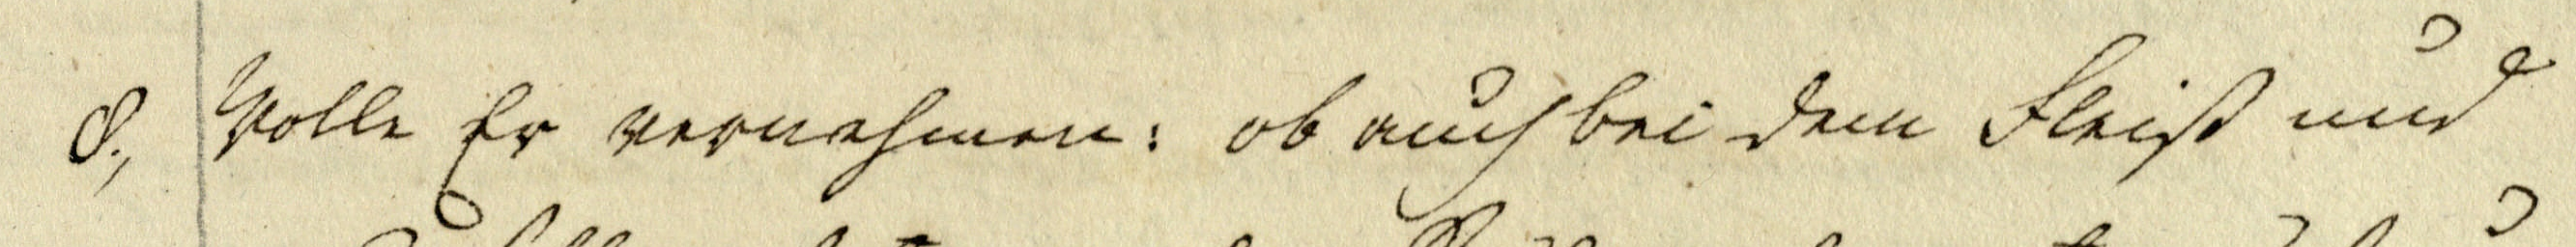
8., Wolle Er vernehmen: ob auch bei dem Fleiß und
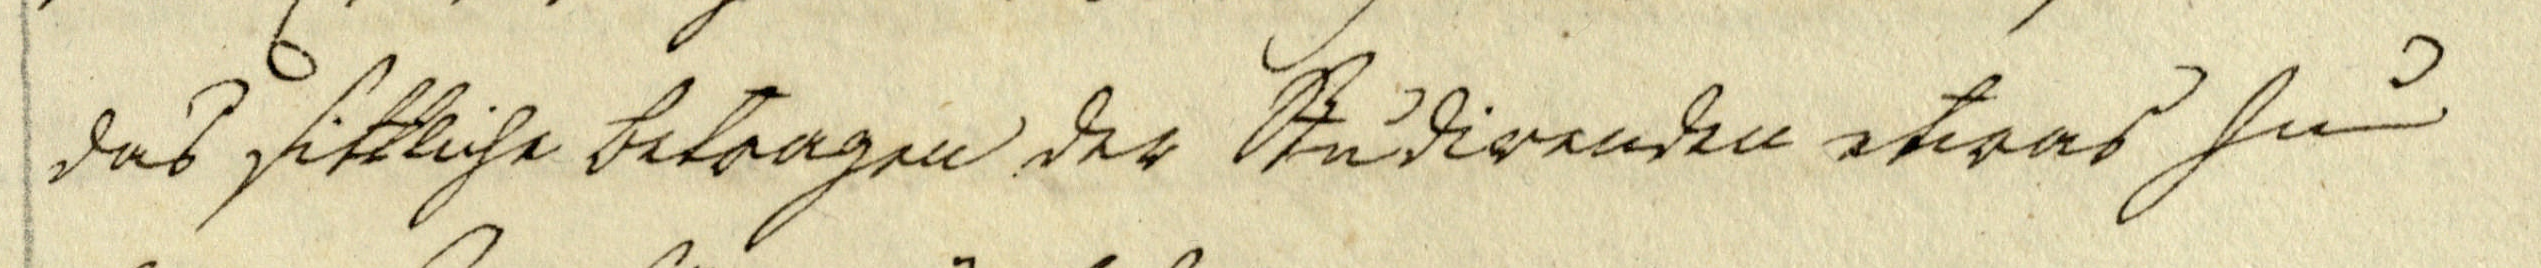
das sittliche Betragen der Studirenden etwas zu
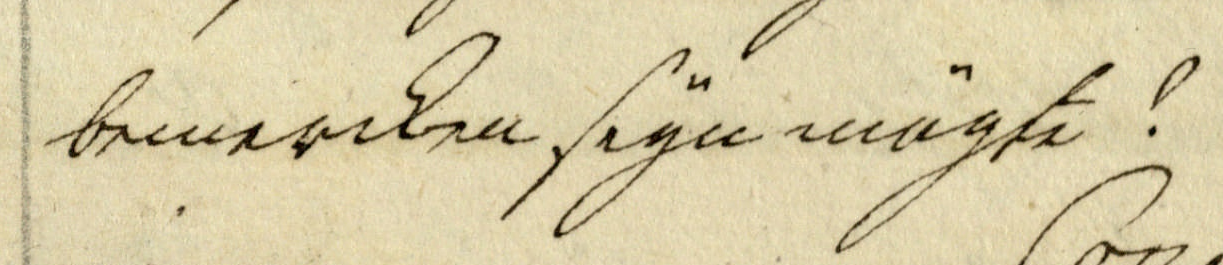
bemercken seÿn mögte?
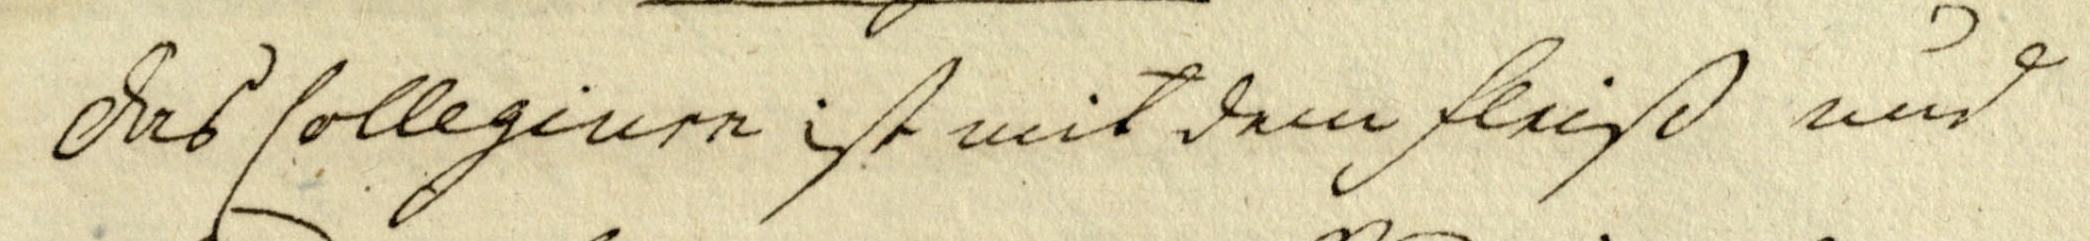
Das Collegium ist mit dem Fleiß und
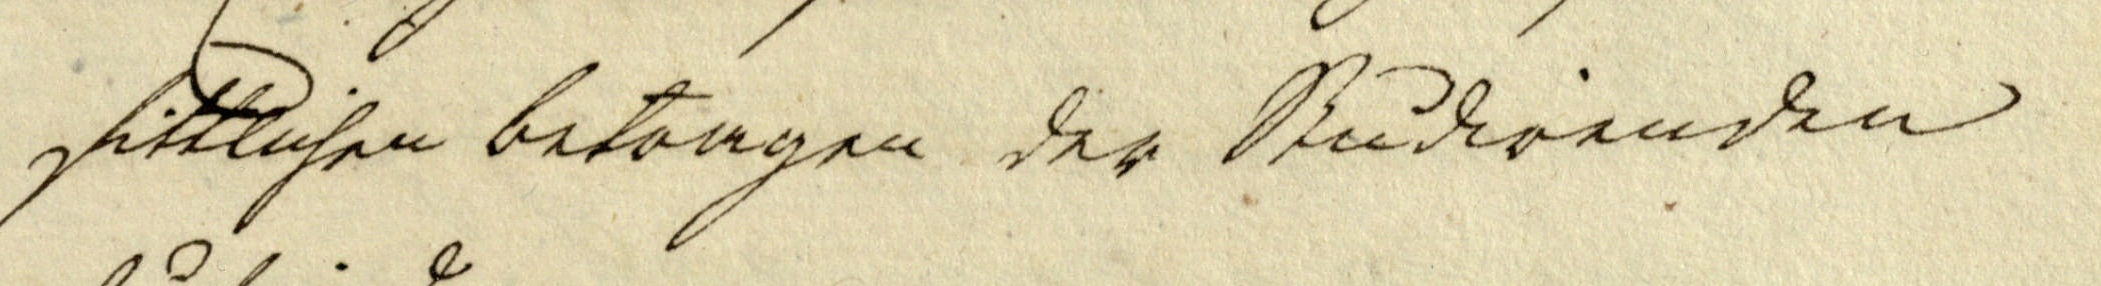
sittlichen Betragen der Studirenden
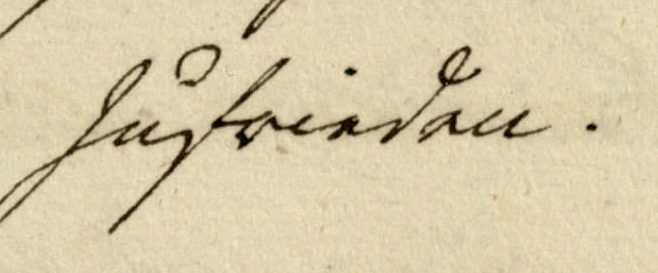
zufrieden.
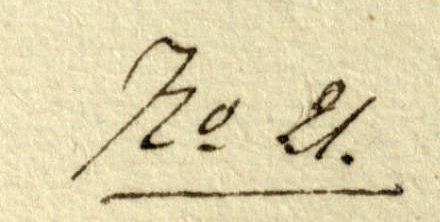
No 21.
